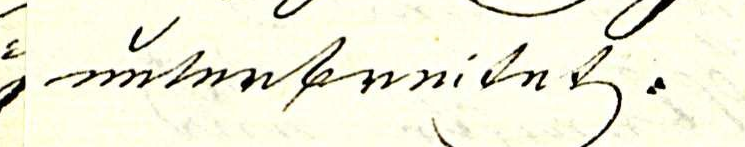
unterbreitet.
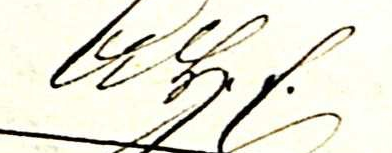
a. E.
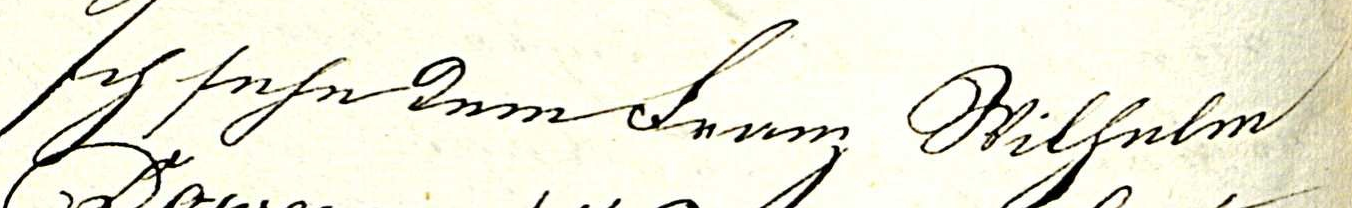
Ich sehe dem Franz Wilhelm
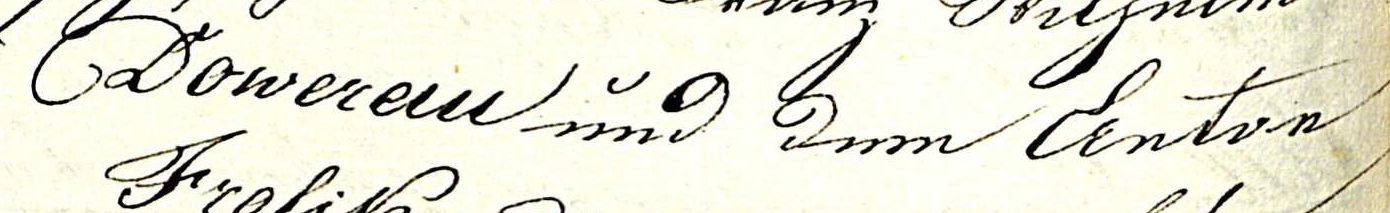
Dowerau und dem Anton
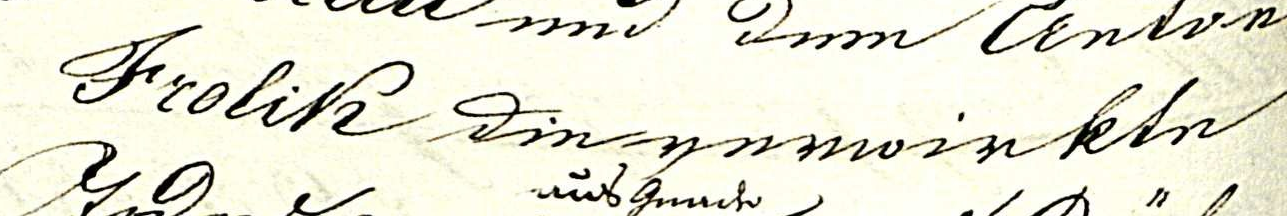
Frolik die verwirkte
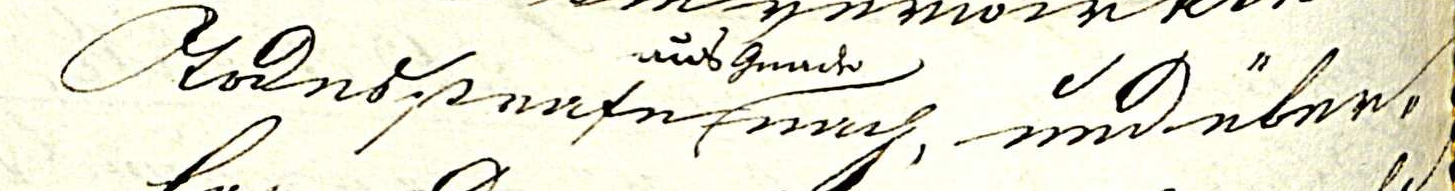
aus Gnade
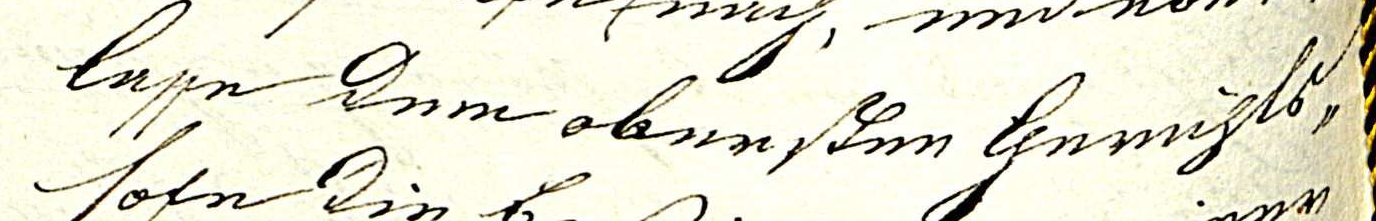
lasse dem obersten Gerichts¬
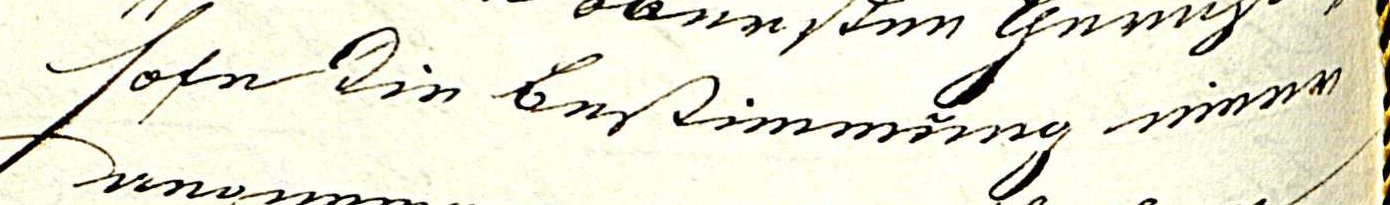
hofe die Bestimmung einer
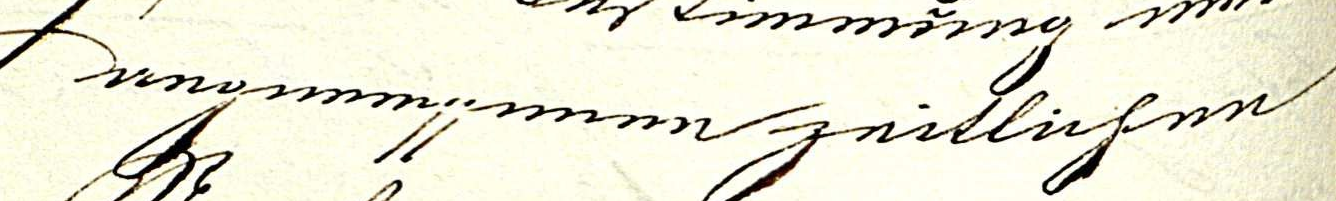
angemessenen zeitlichen
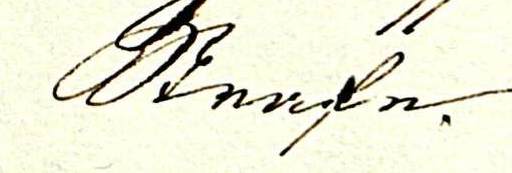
Strafe.
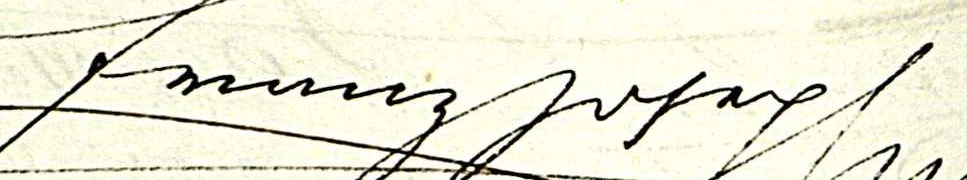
Franz Joseph
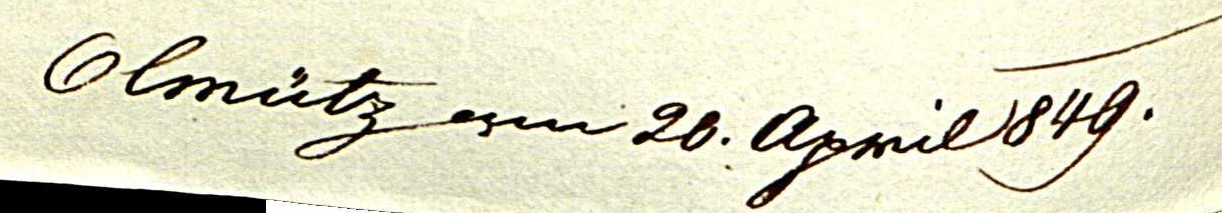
Olmütz am 20. April 1849
